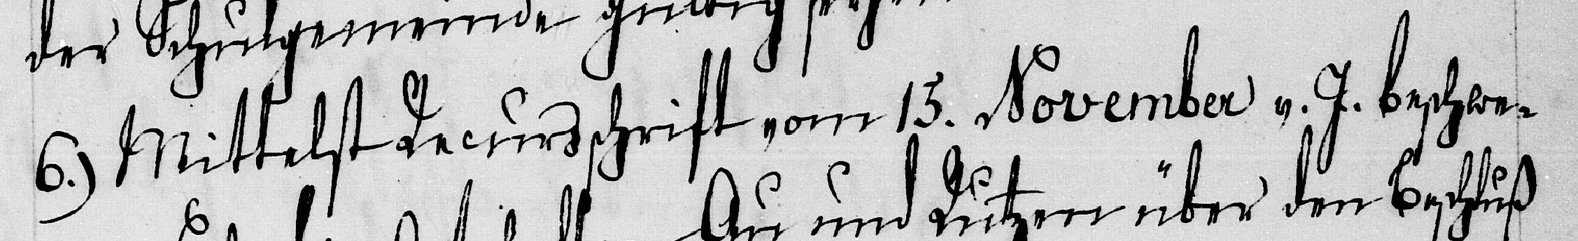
6.) Mittelst Recursschrift vom 13. November v. J. beschwe¬
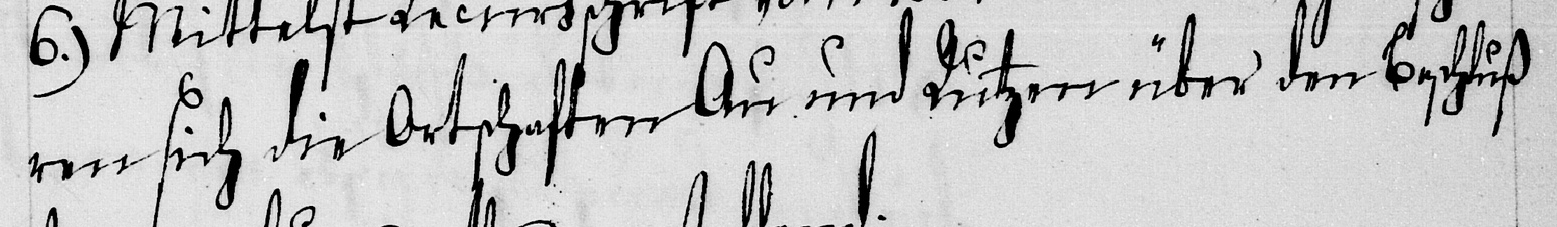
ren sich die Ortschaften Au und Rutzen über den Beschluß
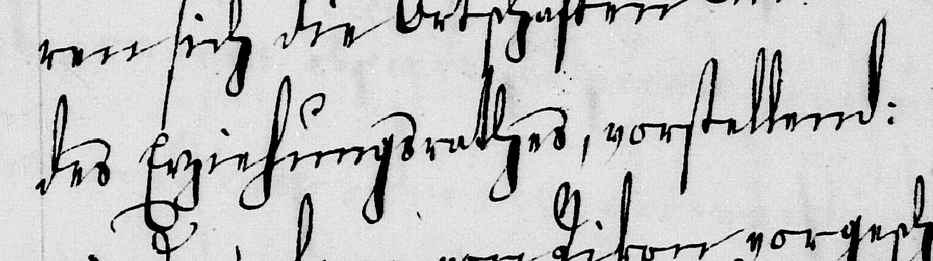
des Erziehungsrathes, vorstellend:
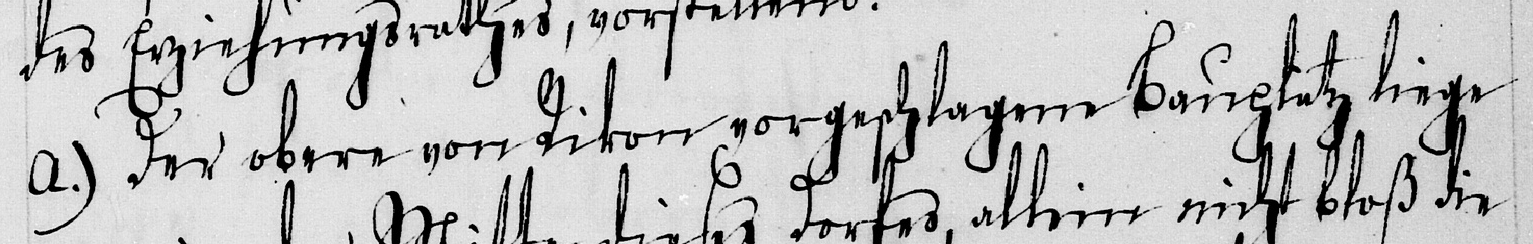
A.) Der obere von Rikon vorgeschlagene Bauplatz liege
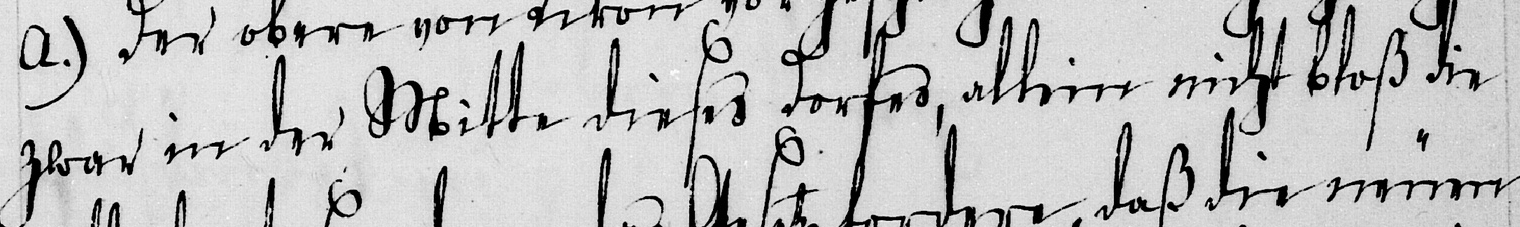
zwar in der Mitte dieses Dorfes, allein nicht bloß die
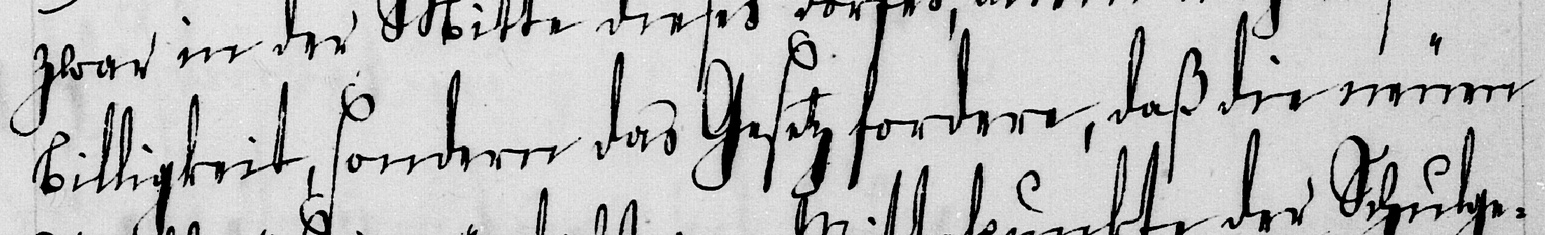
illigkeit, sondern das Gesetz fordern, daß die neuen
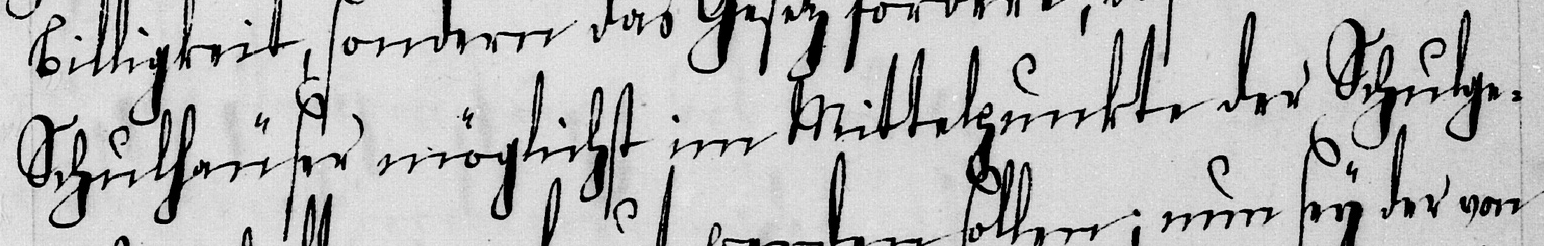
Schulhäuser möglichst im Mittelpunkt der Schulge¬
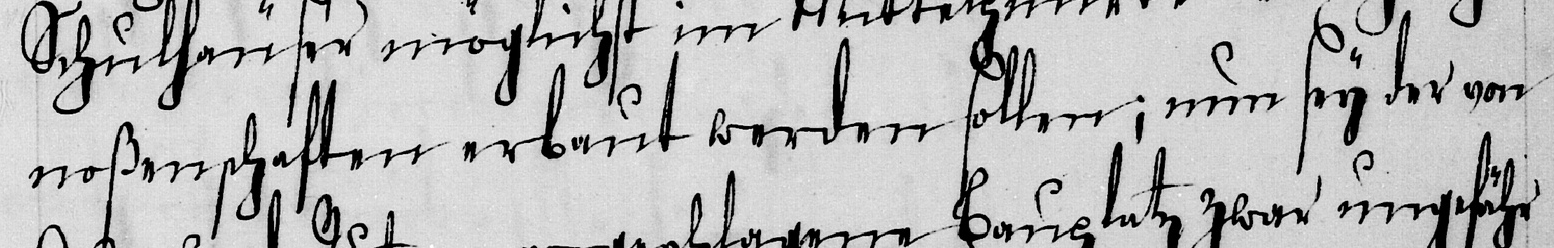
noßenschaften erbaut werden sollen; und sey der von
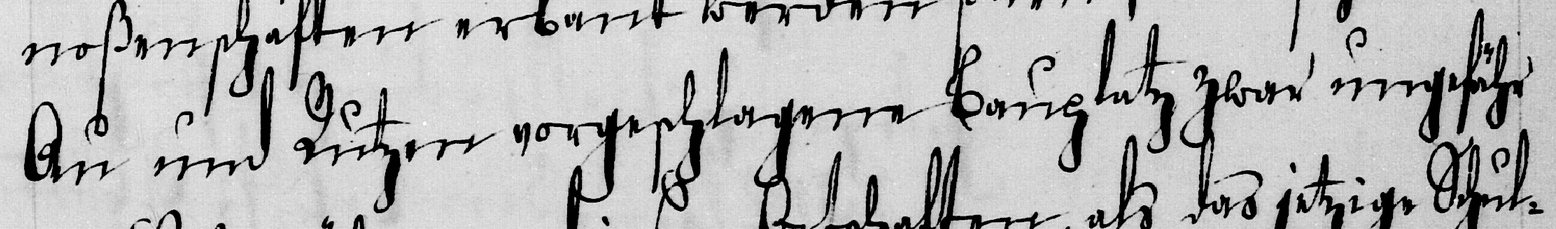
Au und Rutzen vorgeschlagene Bauplatz zwar ungefähr
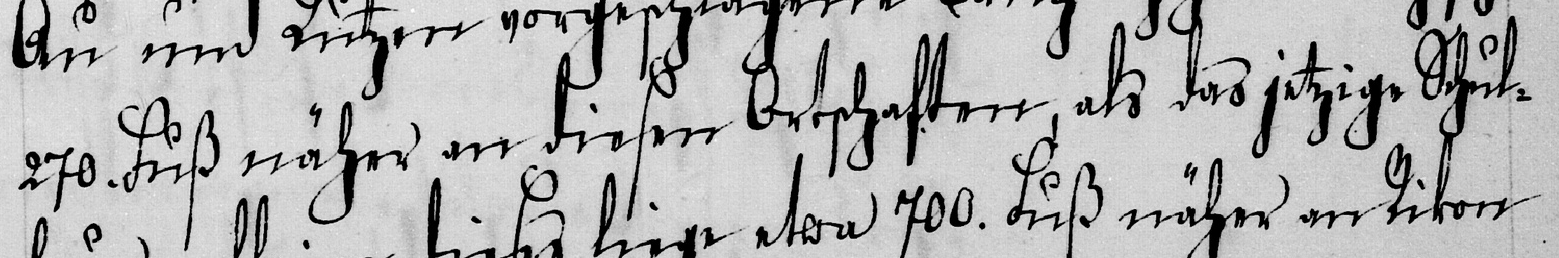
270. Fuß näher an diesen Ortschaften, als das jetzige Schu¬
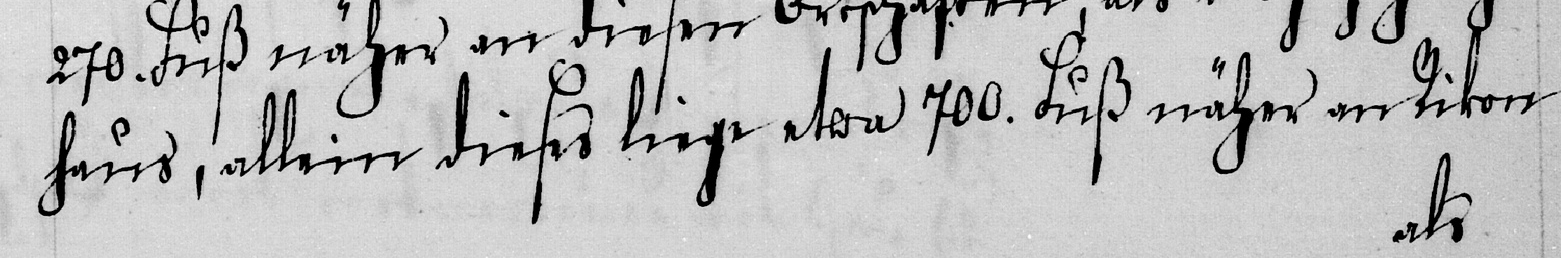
lhaus, allein dieses liege etwa 700. Fuß näher an Rikon
